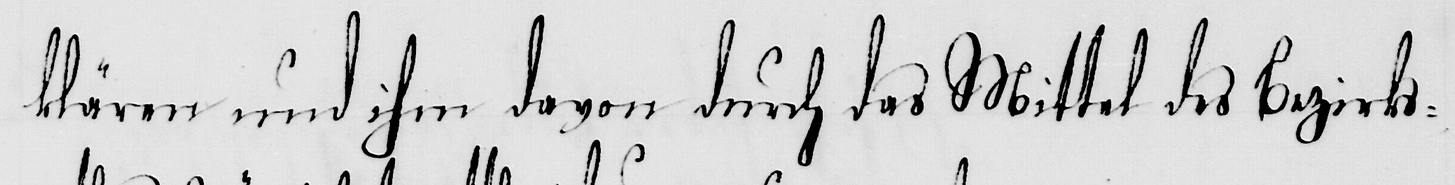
klären und ihm davon durch das Mittel des Bezirks¬
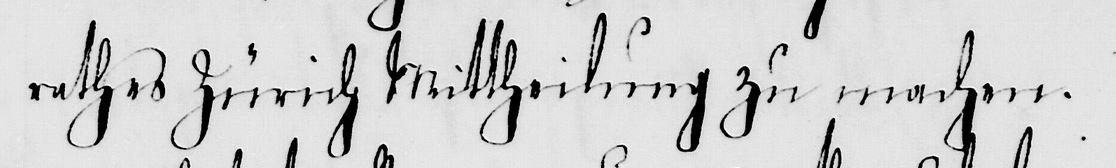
rathes Zürich Mittheilung zu machen.
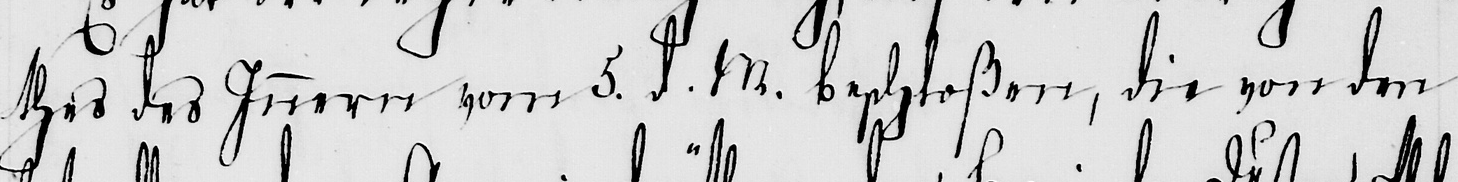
thes des Innern vom 5. d. M. beschloßen, die von den
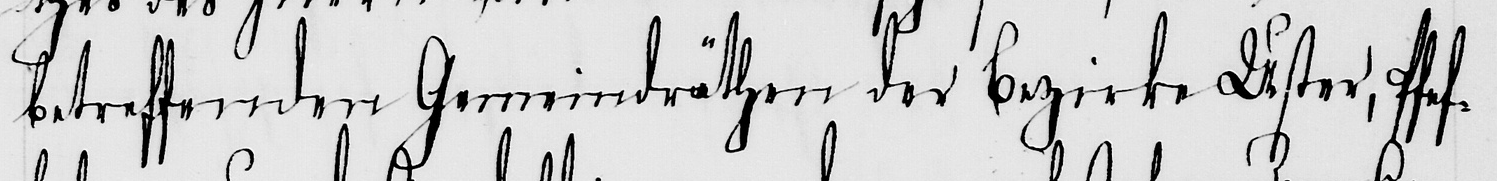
betreffenden Gemeindräthen der Bezirke Uster, Pfef¬
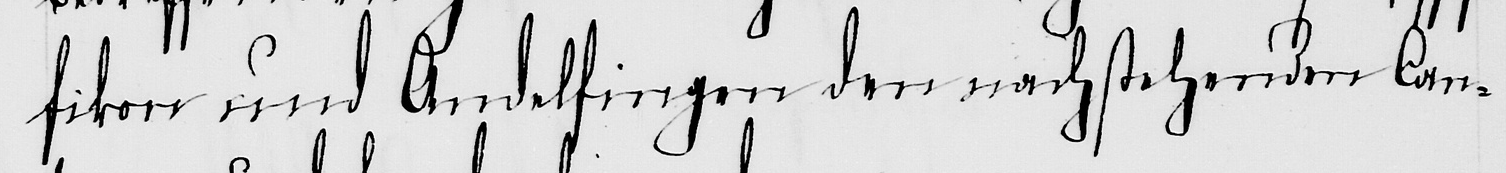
fikon und Andelfingen den nachstehenden Can¬
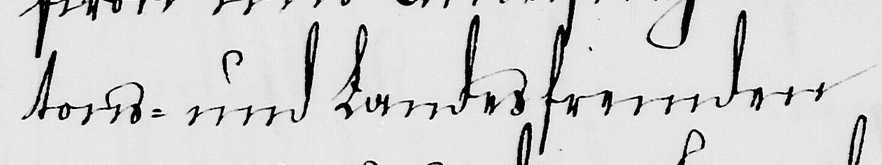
tons- und Landesfremden
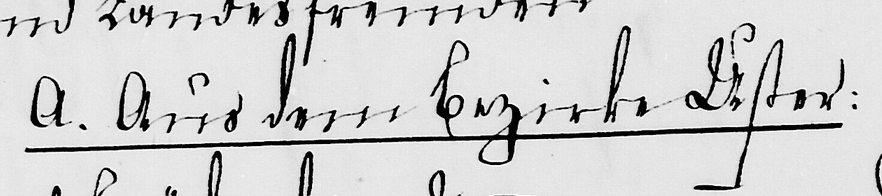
A. Aus dem Bezirke Uster:
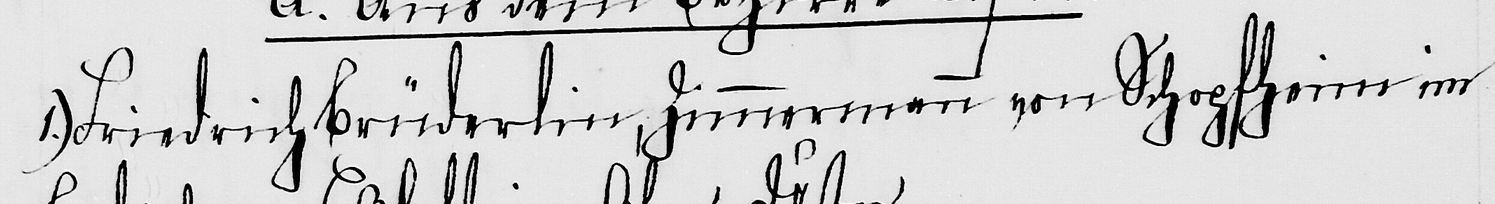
Friedrich Brüderlin, Zimmermann von Schopfheim im
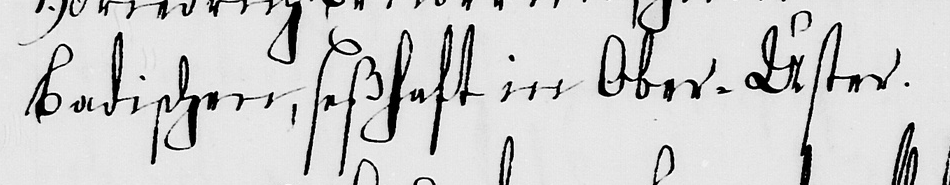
Badischen, seßhaft in Ober-Uster.
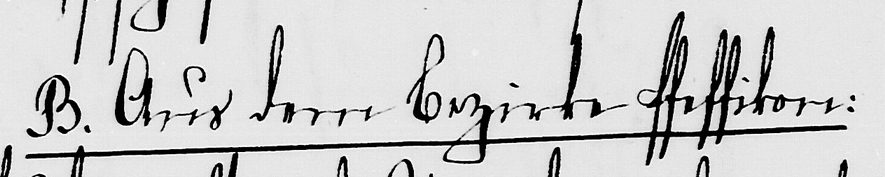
B. Aus dem Bezirke Pfeffikon:
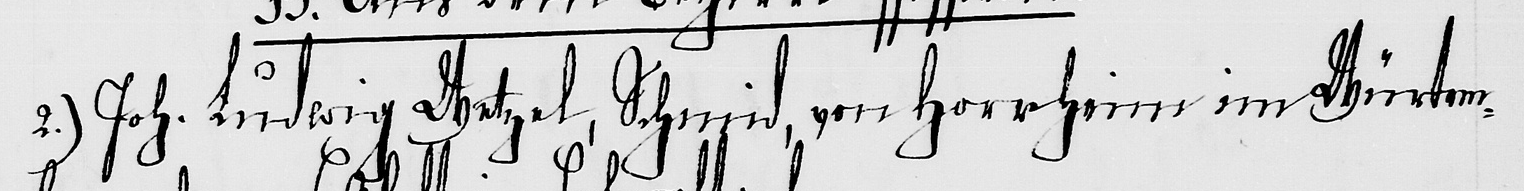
2.) Joh. Ludwig Wetzel, Schmid, von Horrheim im Würtem¬
